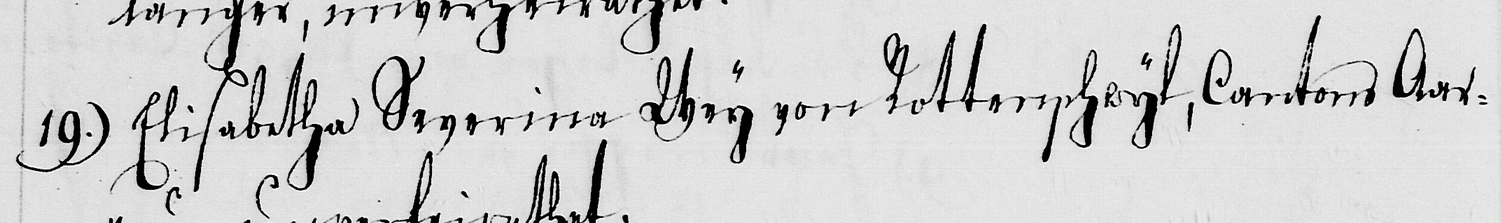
19.) Elisabetha Severina Wey von Rottenschwyl, Cantons Aar¬
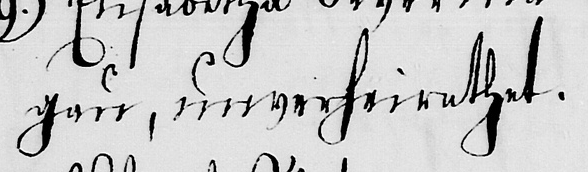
gau, unverheirathet.
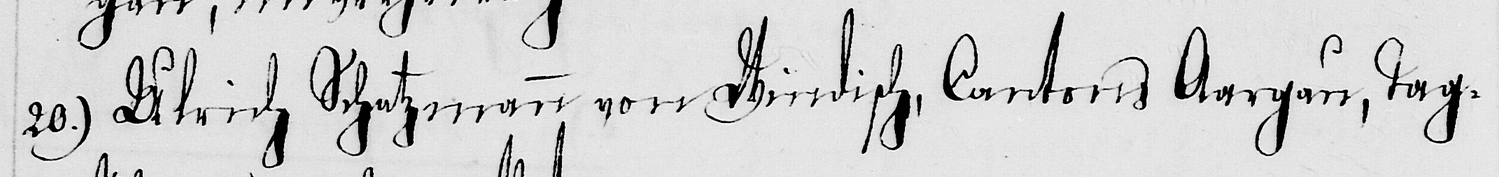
20.) Ulrich Schatzmann von Windisch, Cantons Aargau, Tag¬
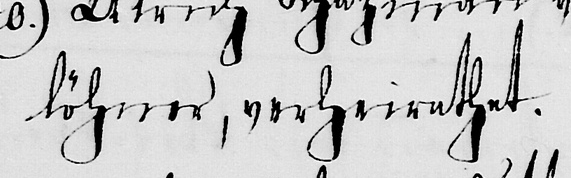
löhner, verheirathet.
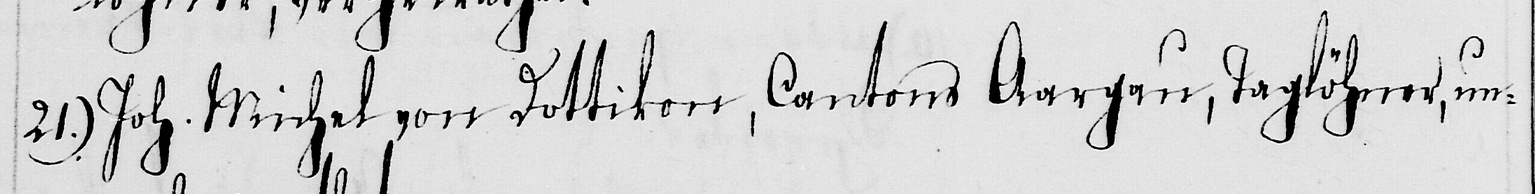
21.) Joh. Michel von Dottikon, Cantons Aargau, Taglöhner, un¬
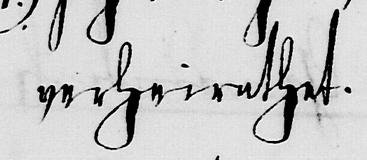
verheirathet.
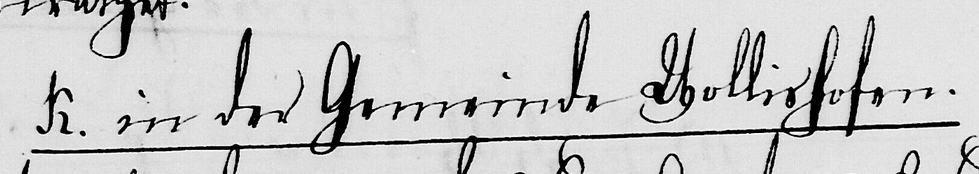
k. in der Gemeinde Wollishofen.
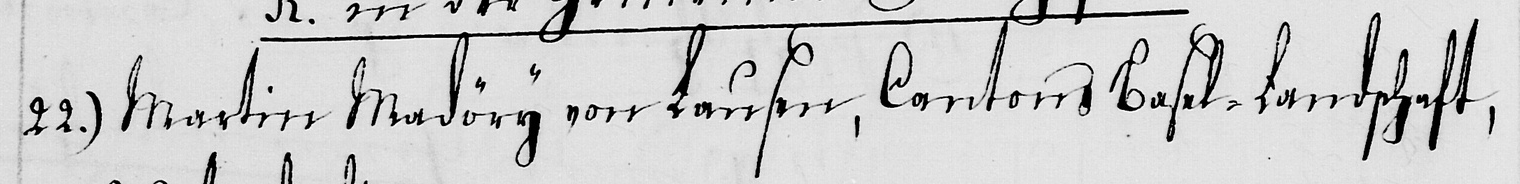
22.) Martin Madöry von Lausen, Cantons Basel-Landschaft,
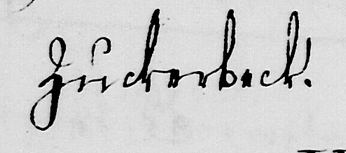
Zuckerbeck.
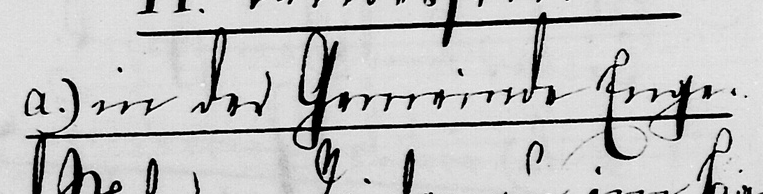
a.) in der Gemeinde Enge.
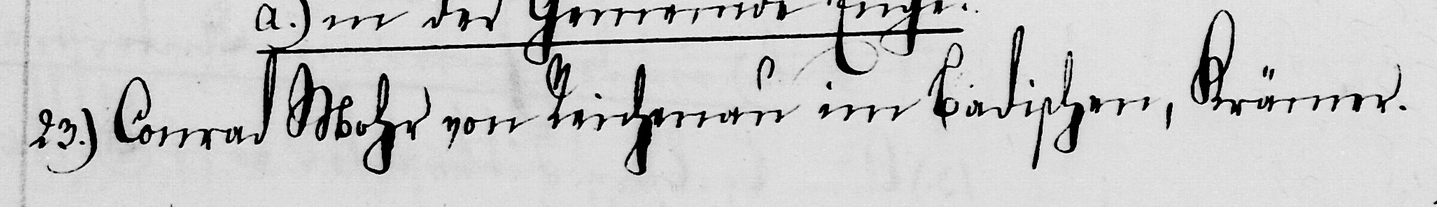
23.) Conrad Mohr von Reichnau im Badischen, Krämer.
